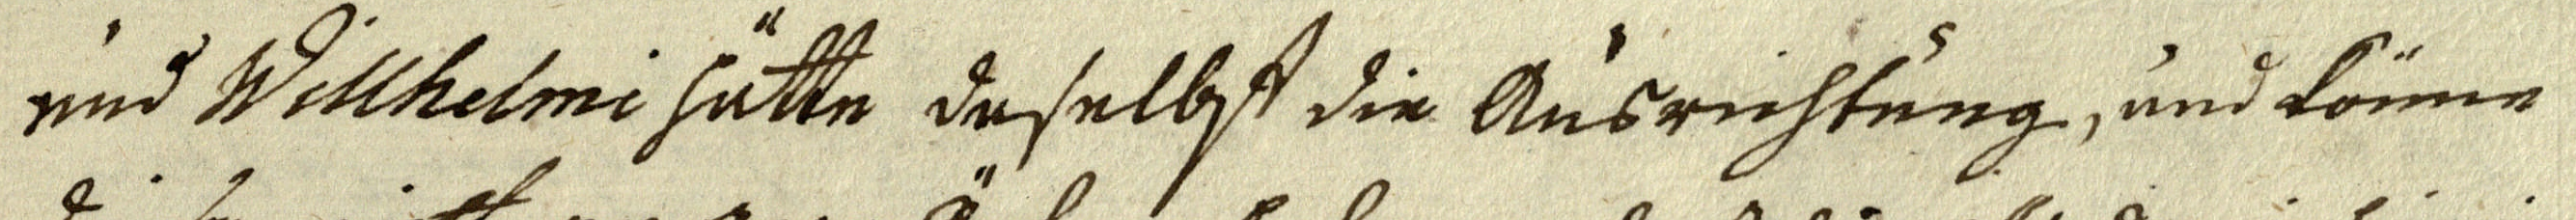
und Willhelmi hätte daselbst die Ausrichtung, und könne
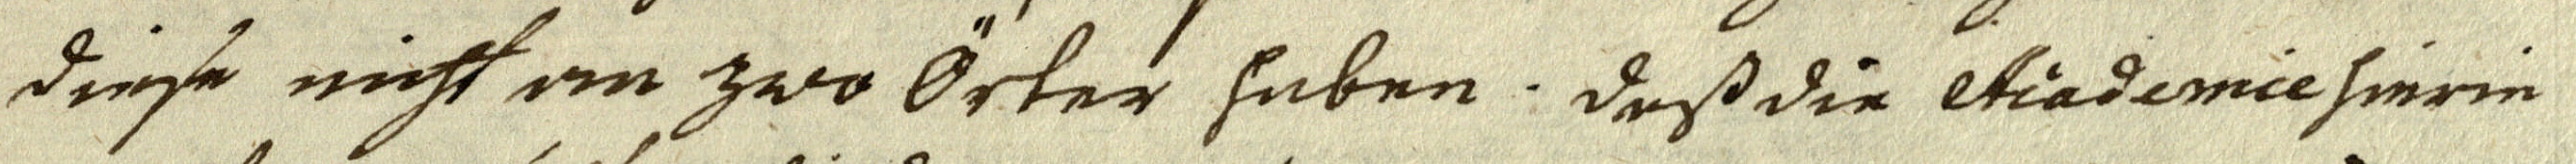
diese nicht an zwo Örter haben. Daß die Academie hierin
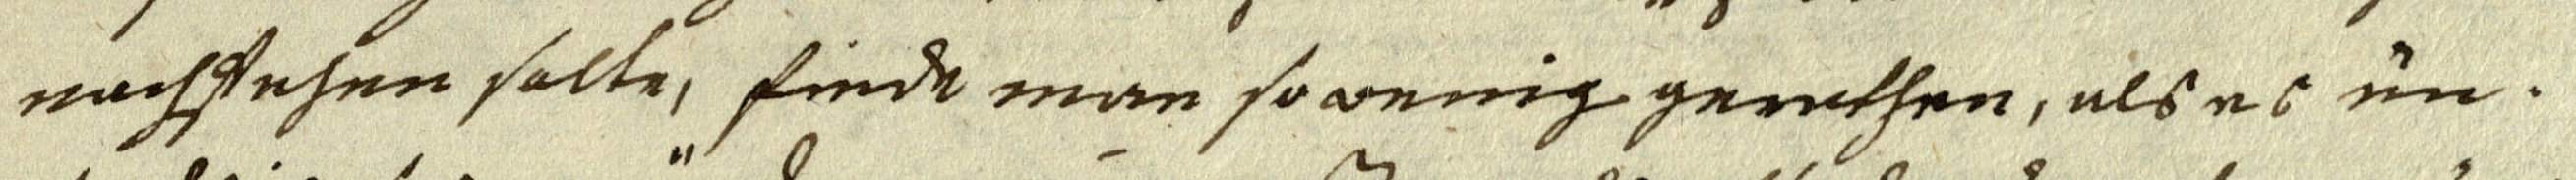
nachstehen solte, finde man so wenig gerathen, als es un¬
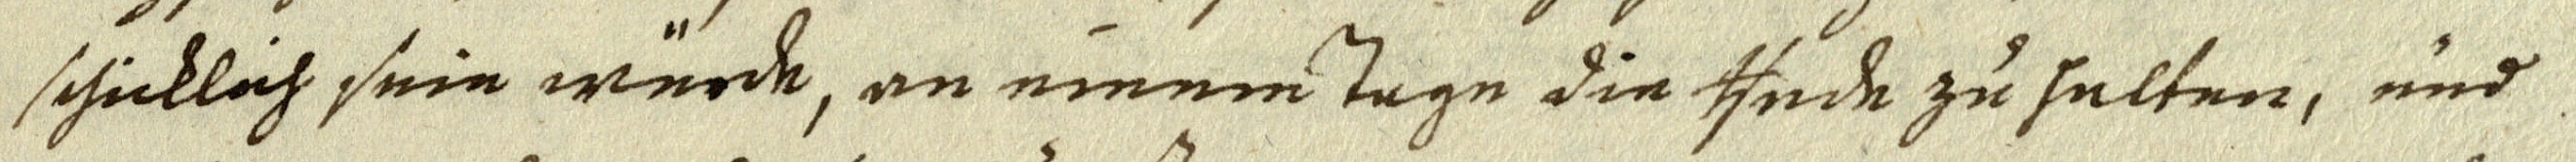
schicklich sein würde, an einem Tage die Rede zu halten, und
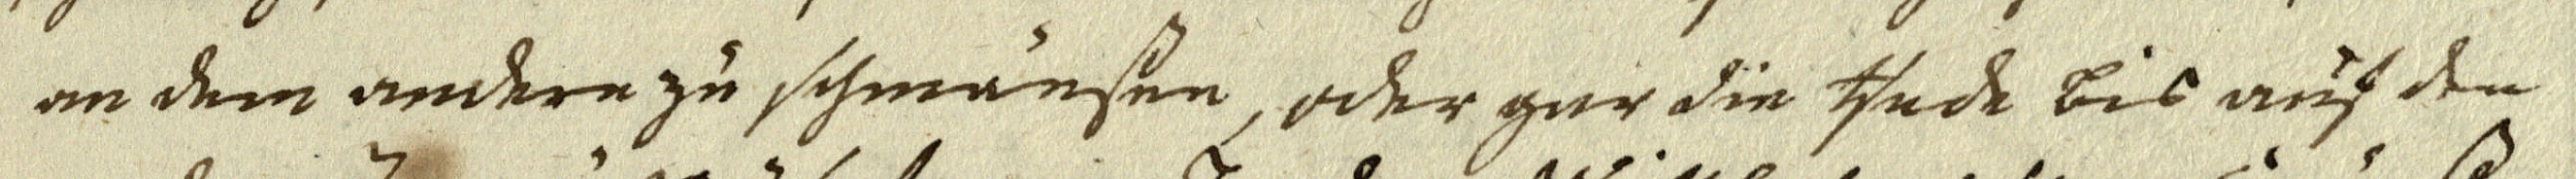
an dem andern zu schmaußen, oder gar die Rede bis auf den
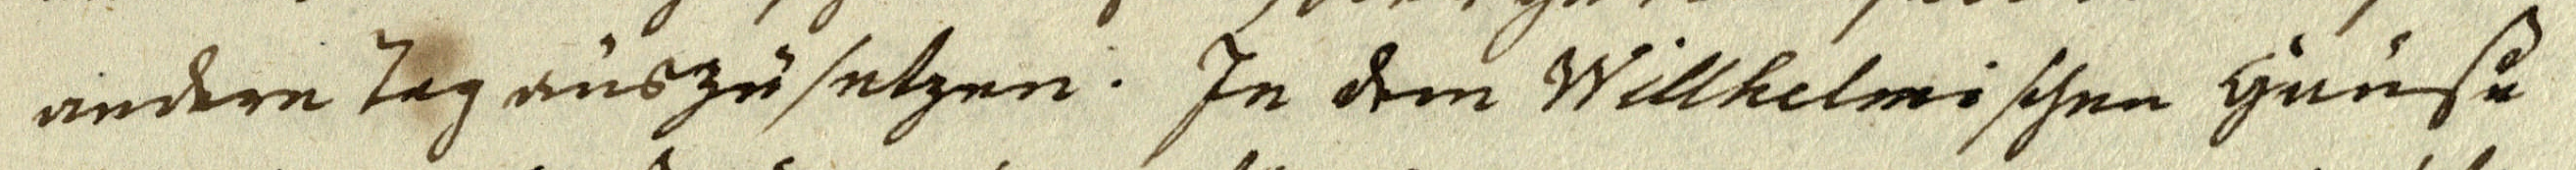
andern Tag auszusetzen. In dem Willhelmischen Hauße
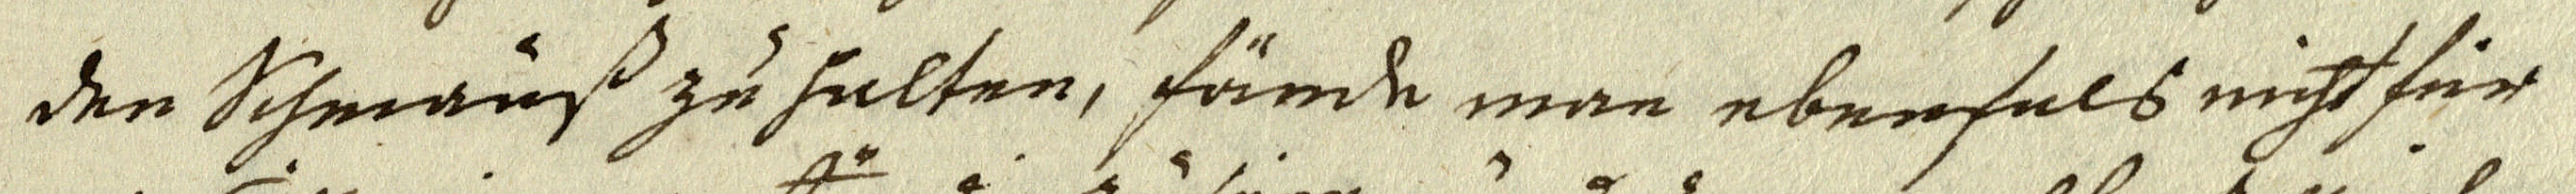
den Schmauß zu halten, fände man ebenfalls nicht für
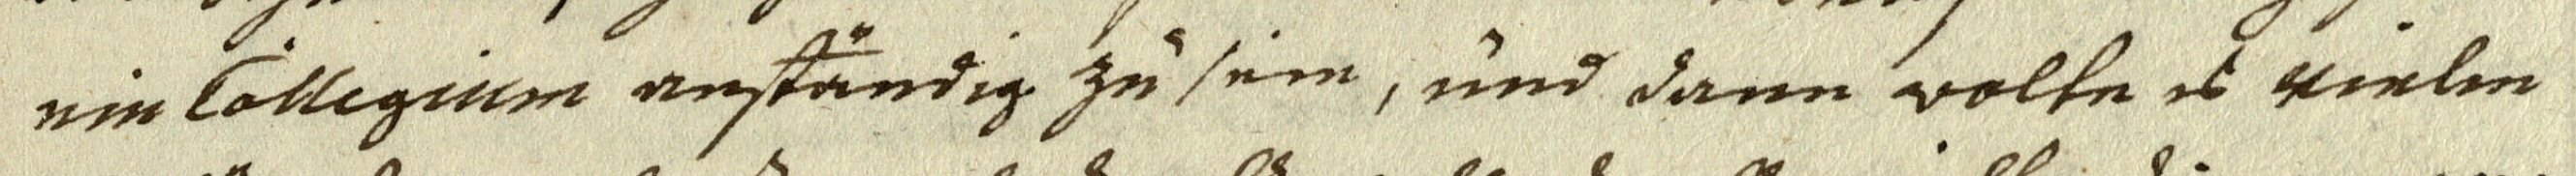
ein Collegium anständig zu sein, und dann wollte es vielen
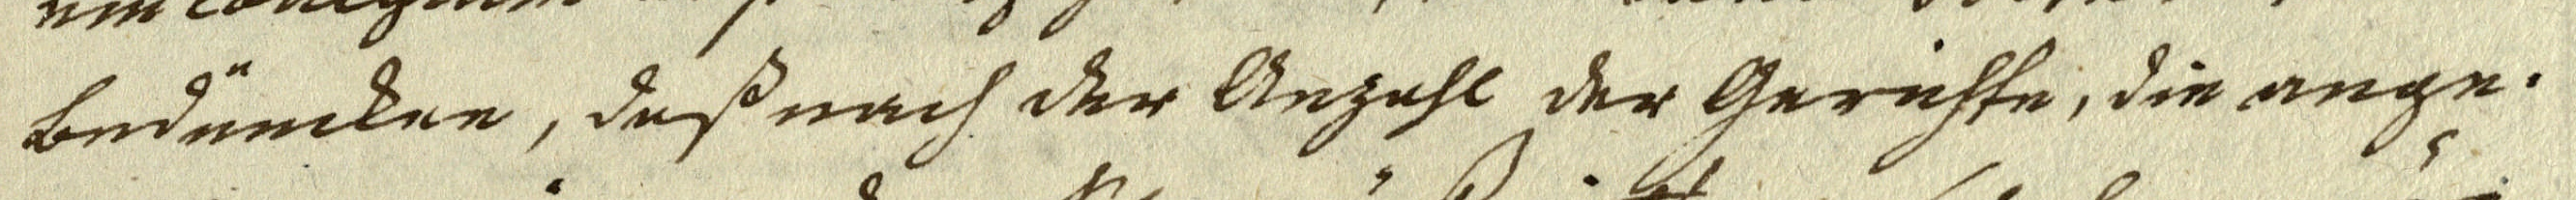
bedüncken, daß nach der Anzahl der Gerichte, die ange¬
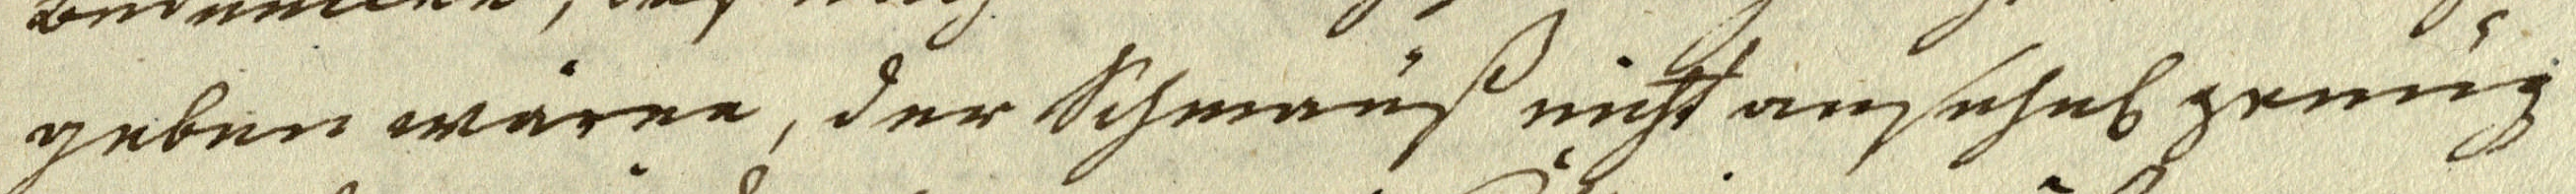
geben wären, der Schmauß nicht ansehnl. genug
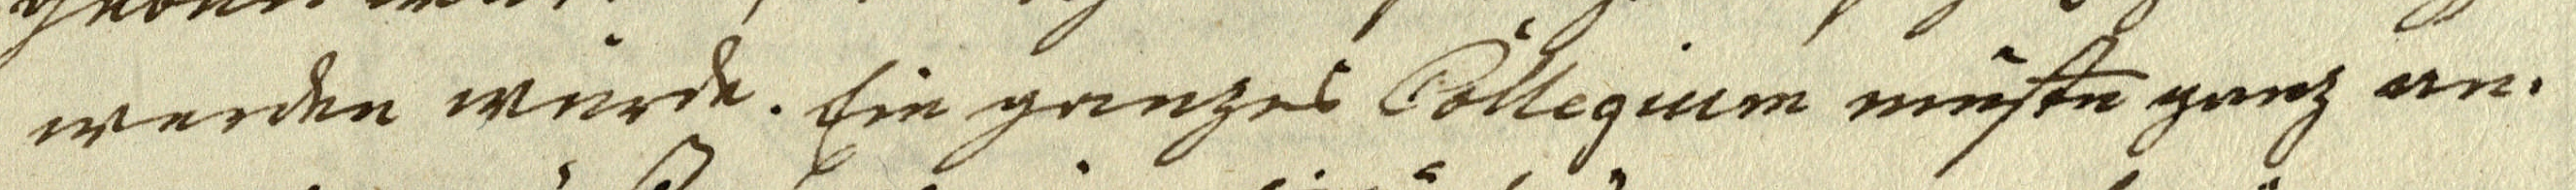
werden würde. Ein ganzes Collegium müste ganz an¬
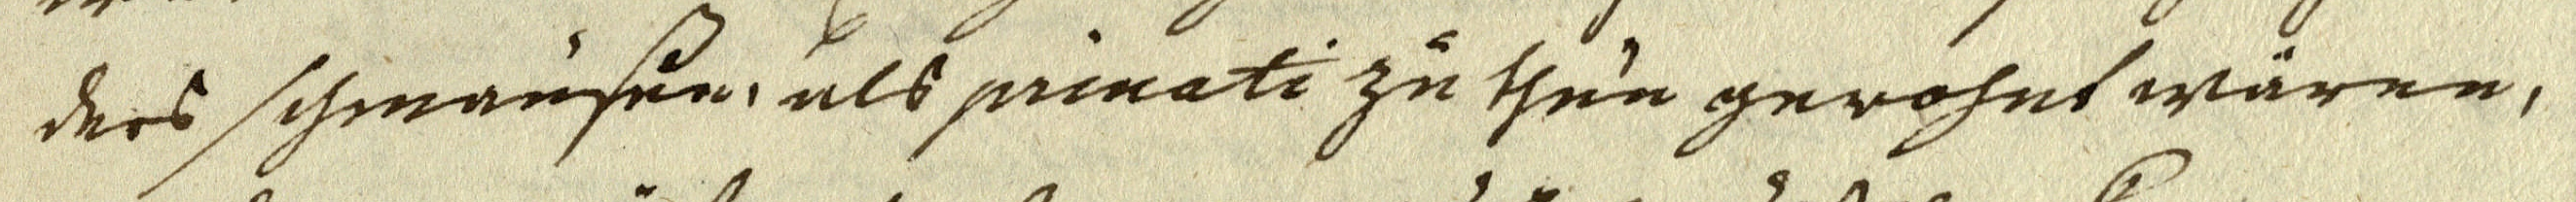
ders schmaußen, als privati zu thun gewohnt wären,
